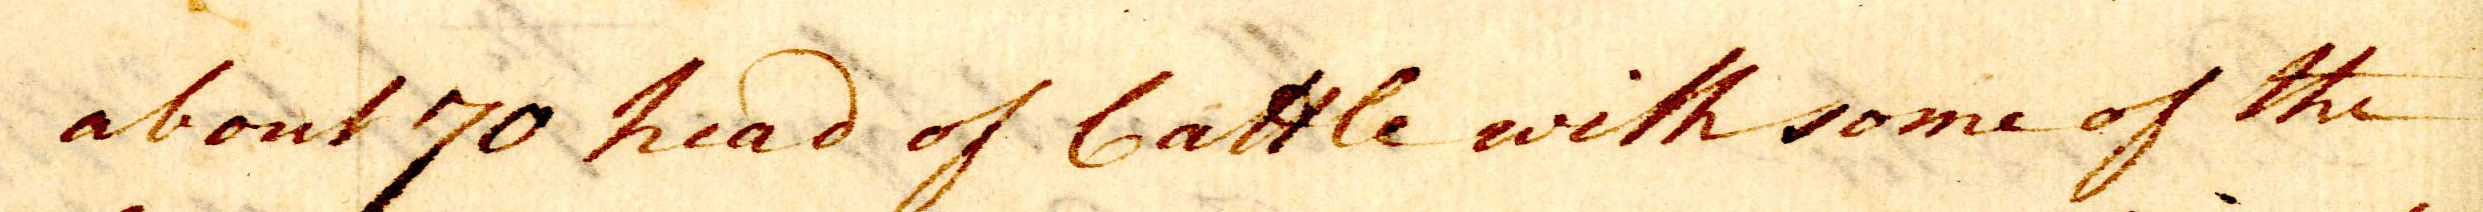about 70 head of Cattle with some of the
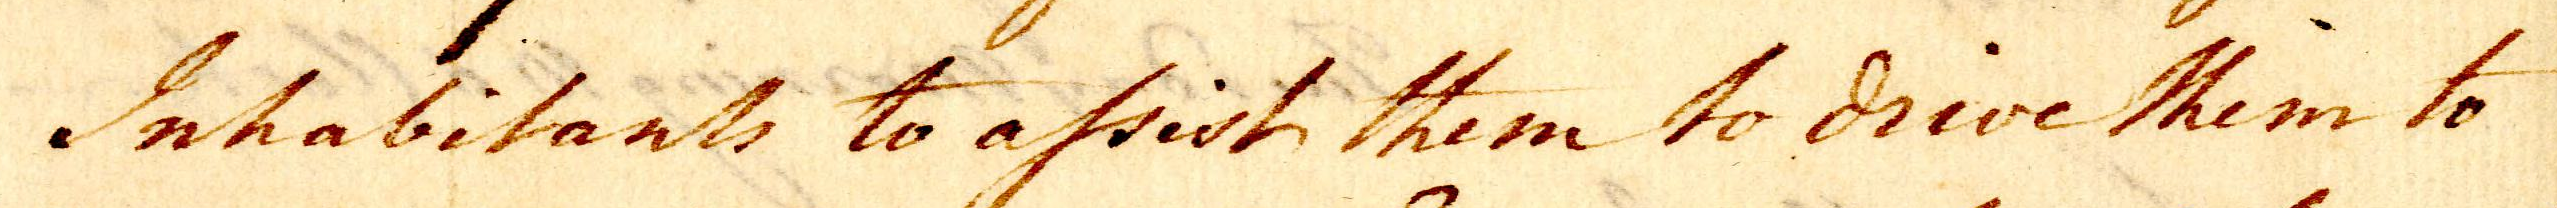Inhabitants to assist them to drive them to
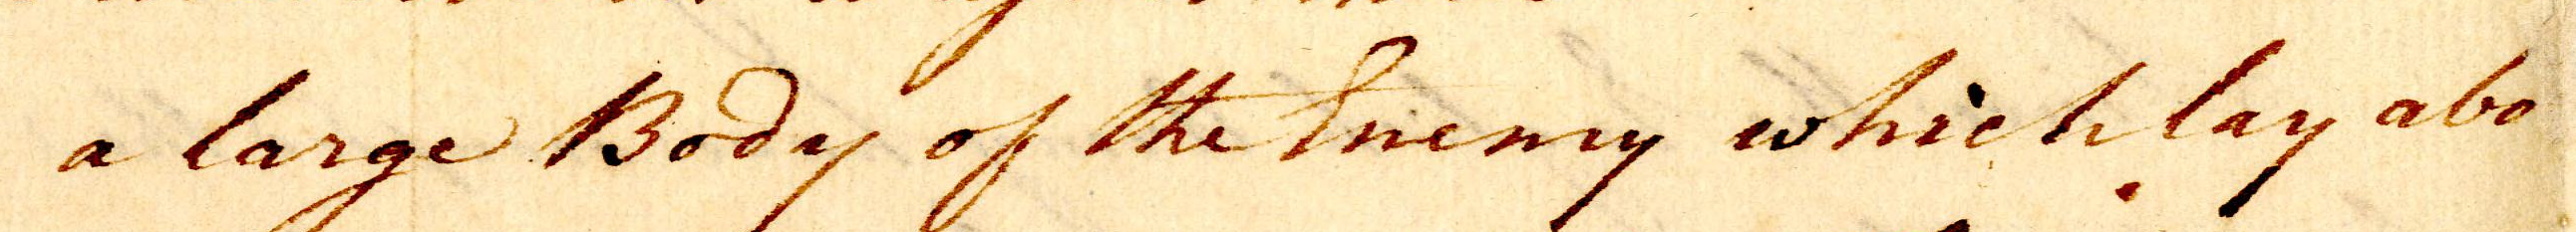a large Body of the Enemy which lay abo
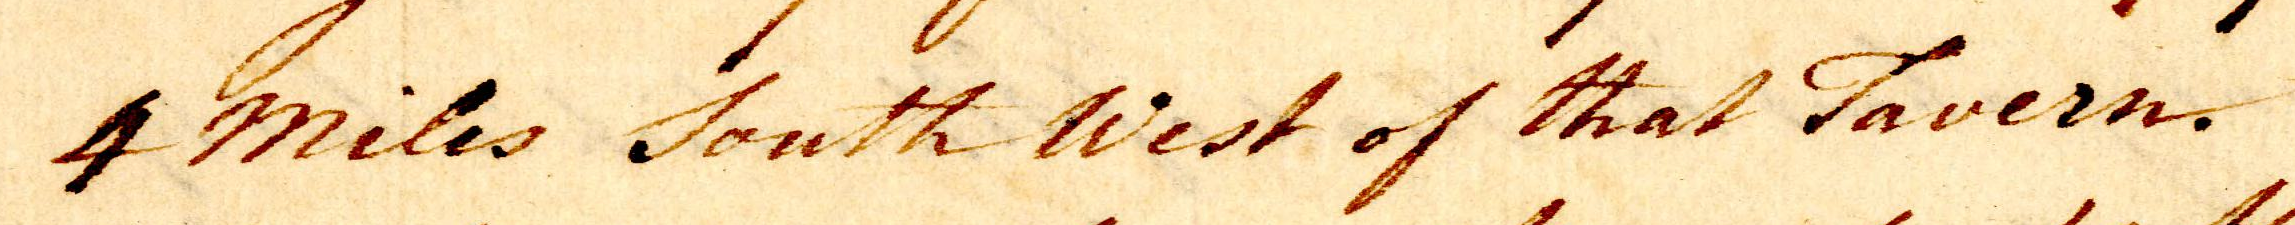4 miles South West of that Tavern.
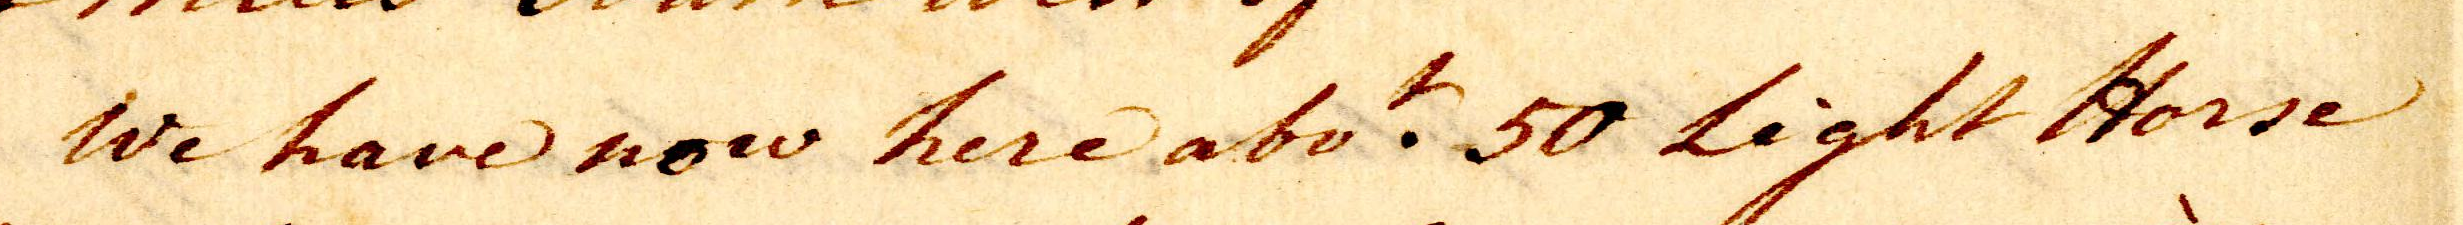We have now here abo^t. 50 Light Horse
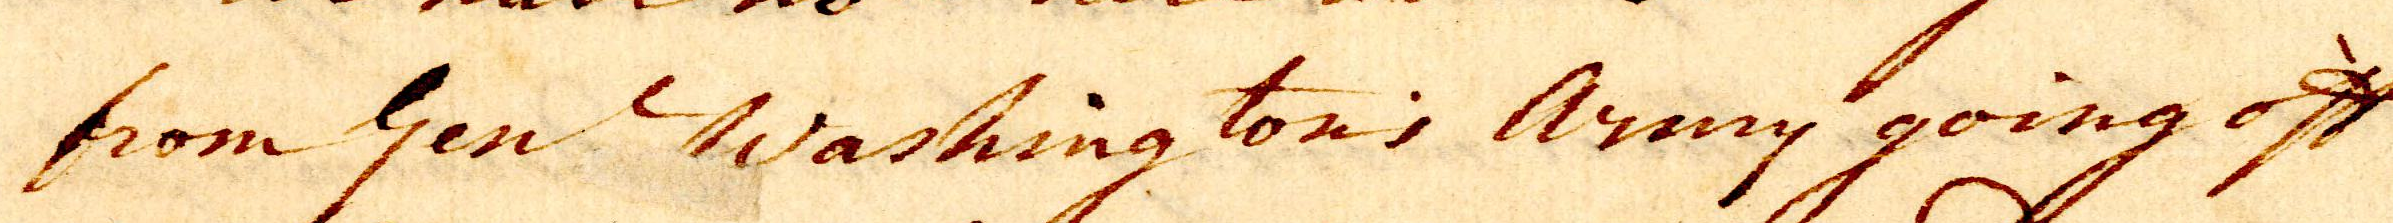from Gen^l Washington's Army going off
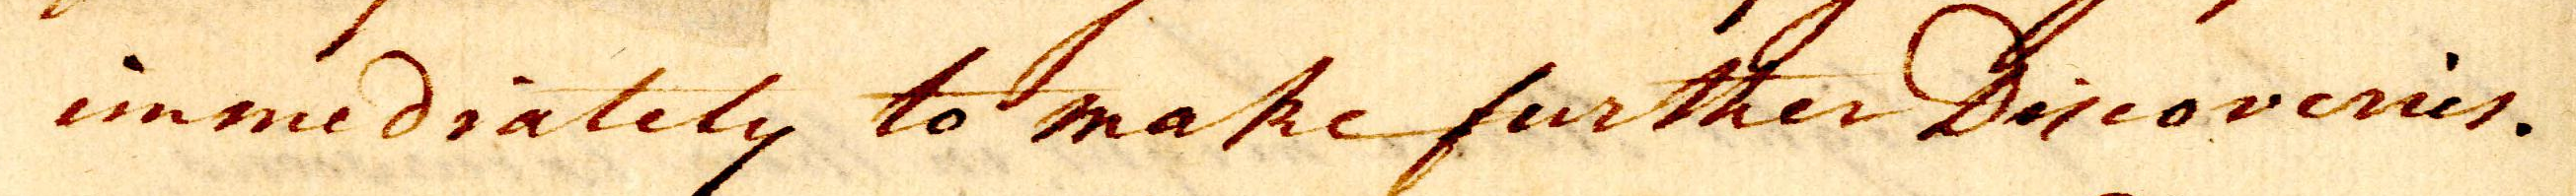immediately to make further Discoveries.
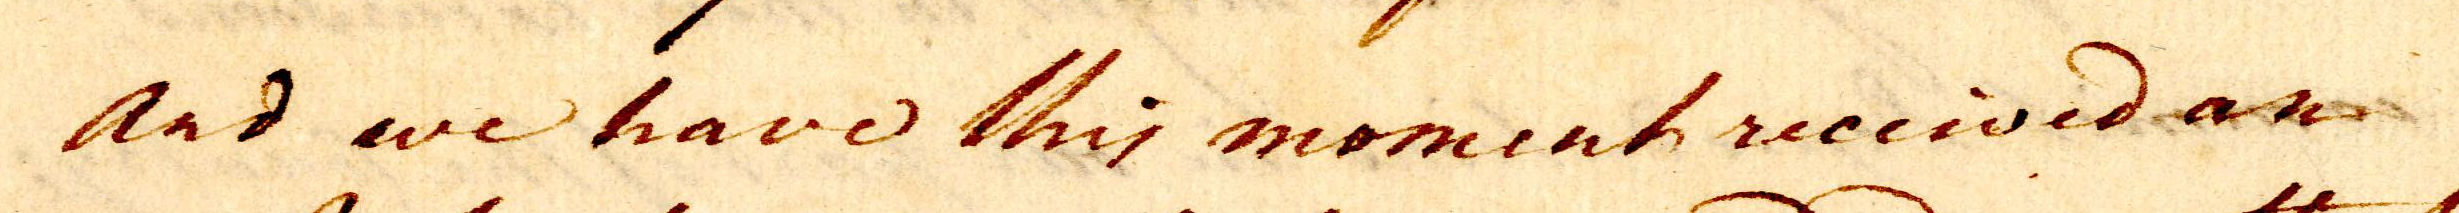And we have this moment received an
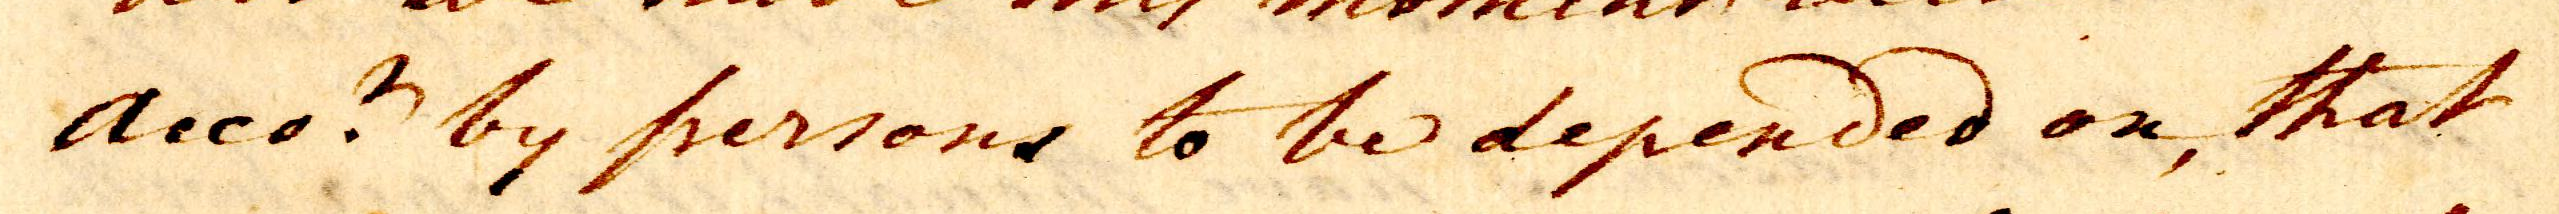Acco^t. by persons to be depended on, that
